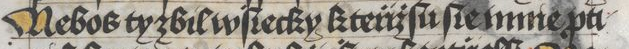Neboť ty zbil wſiecky kteṙižſu ſie mnie ꝓti¬
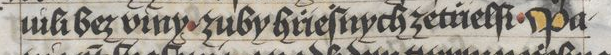uili bez viny.zuby hṙieẛnych zetṙielſi.Pa¬
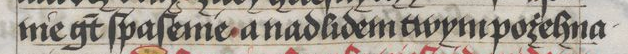nie ḡt ſpaſenie.a nadlidem twym pożehna¬
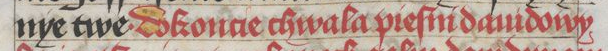nye twe.Dokoncíe chwala píeſni dawidowy
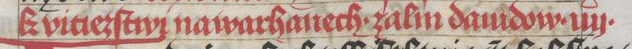k vitiezſtwi nawarhanech.zalm davidow.iiii.
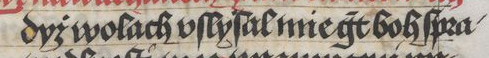dyž wolach uſlyẛal mie ḡt boh ſpra¬
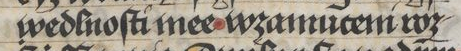wedlnoſti mee.wzarmuceni roz¬
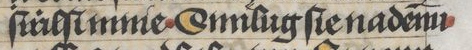ẛiṙilſi mnie.Smilug ſie nadēmu.
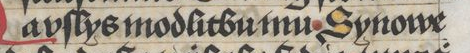a vſlys modlitbu mu.Synowe
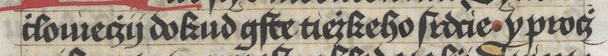ċlowecżij dokud gſte tieżkeho ſrdcie.y procż
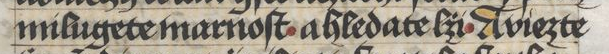milugete marnoſt.a hledate lżi.A viezte
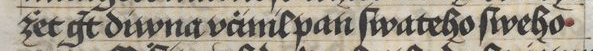żet ḡt diwna uċinil pan ſwateho ſweho.
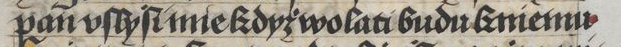pan uſlyẛí mie kdyż wolati budu kniemu.
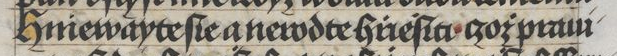Hniewayte ſie a nerodte hṙieẛiti.czož praví¬
